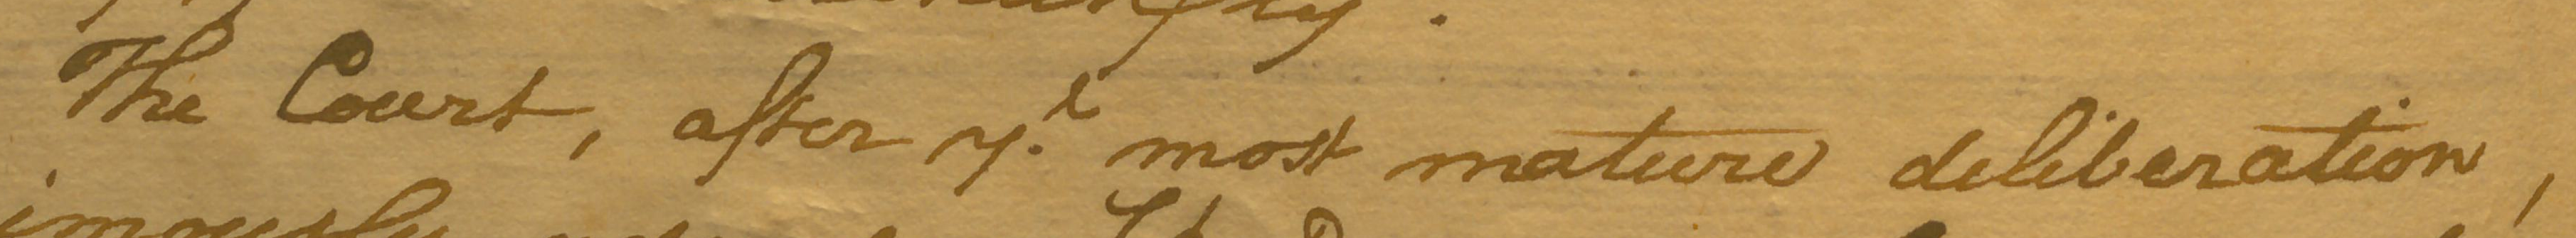The Court, after y^e. most mature deliberation,
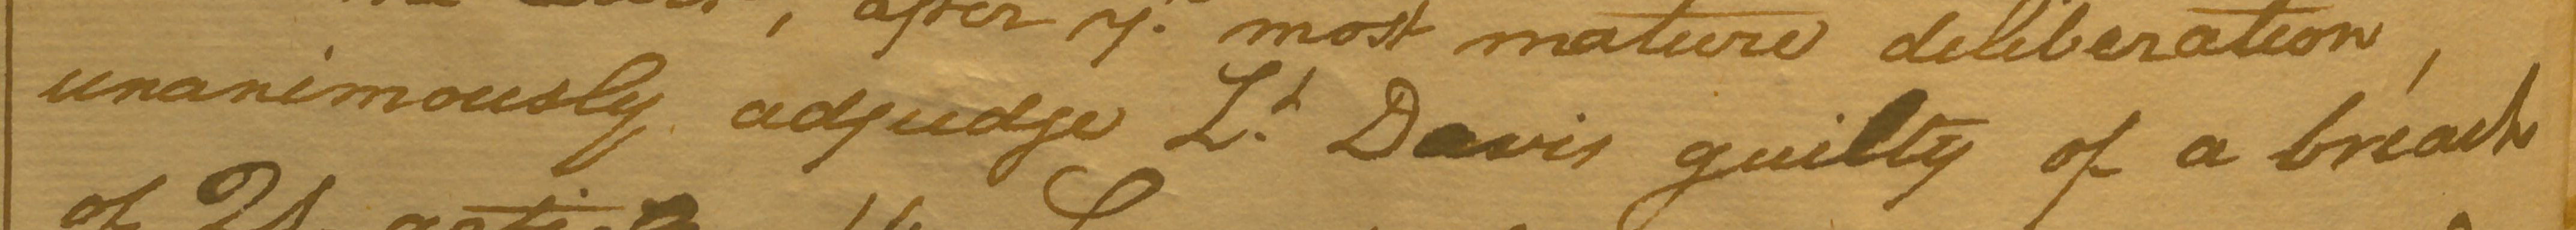unanimously adjudge L^t. Davis guilty of a breach
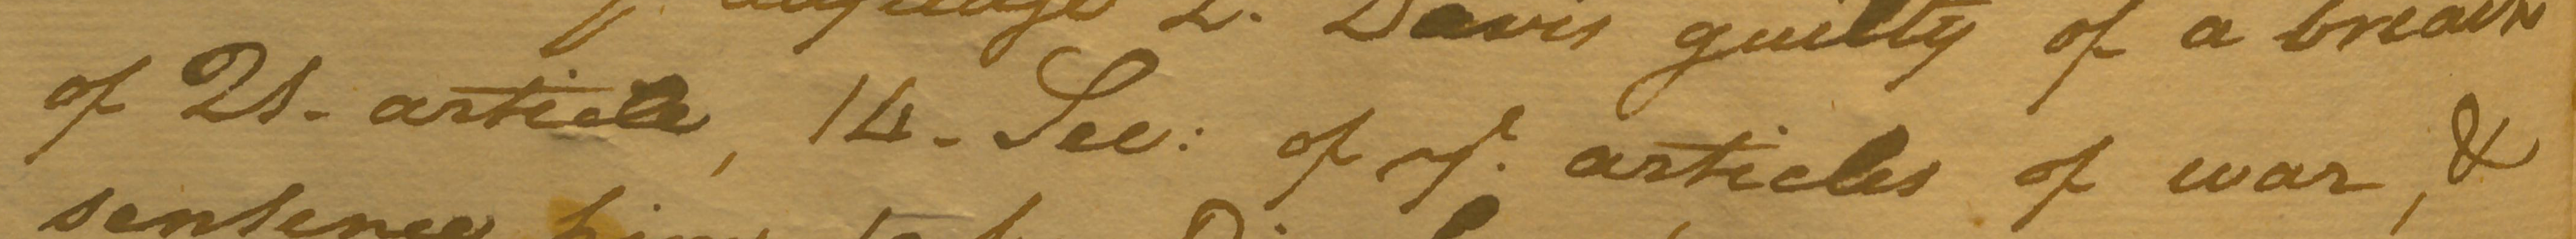of 21. article, 14. Sec: of y^e. articles of war, &
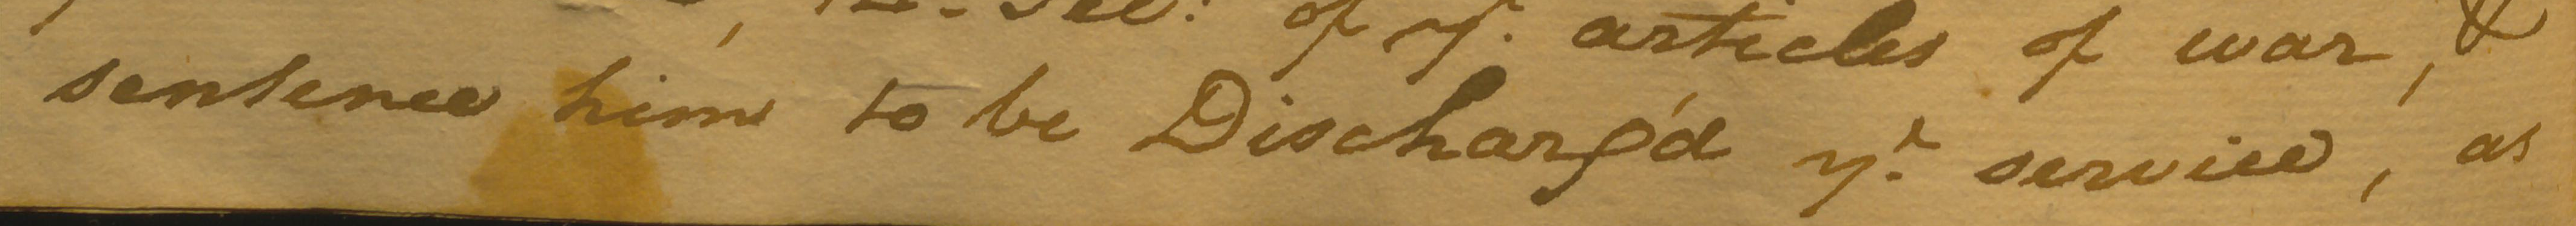sentence him to be Discharg'd y^e. service, as
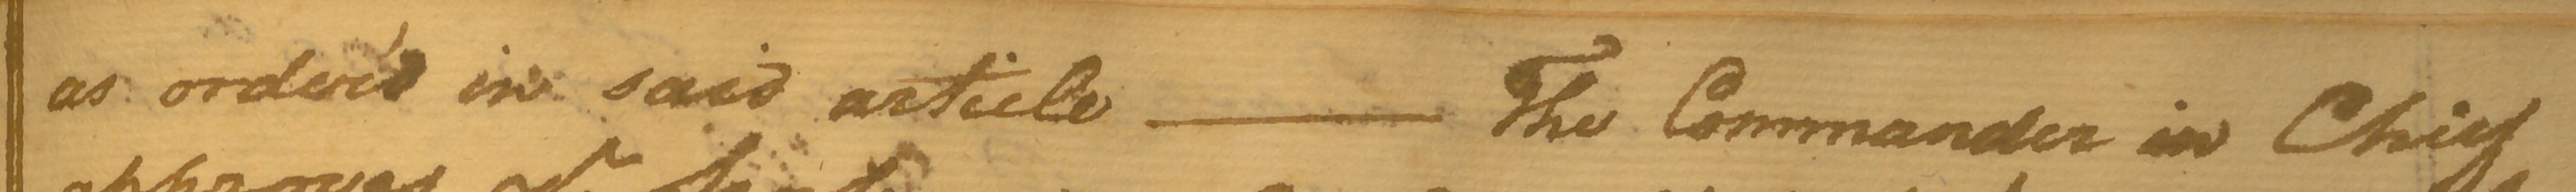as ordered in said article- The Commander in Chief
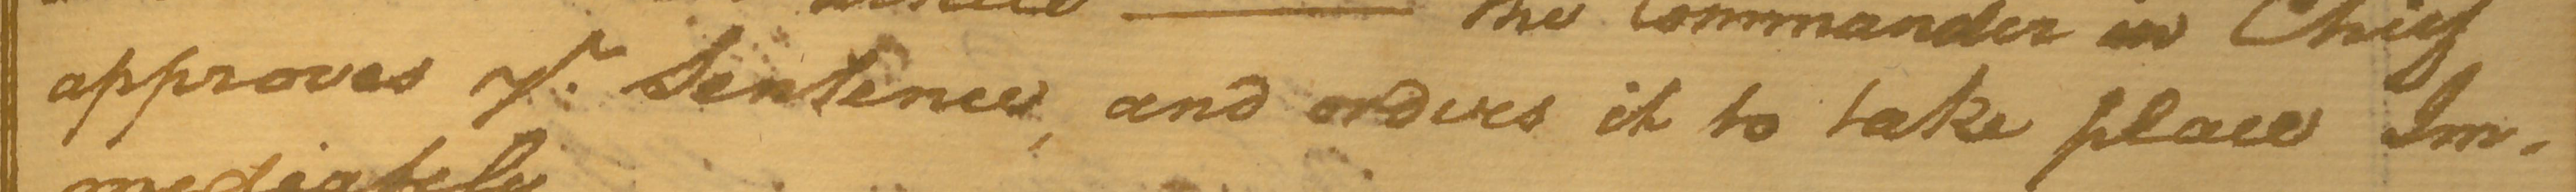approves y^e. Sentence and orders it to take place Im-
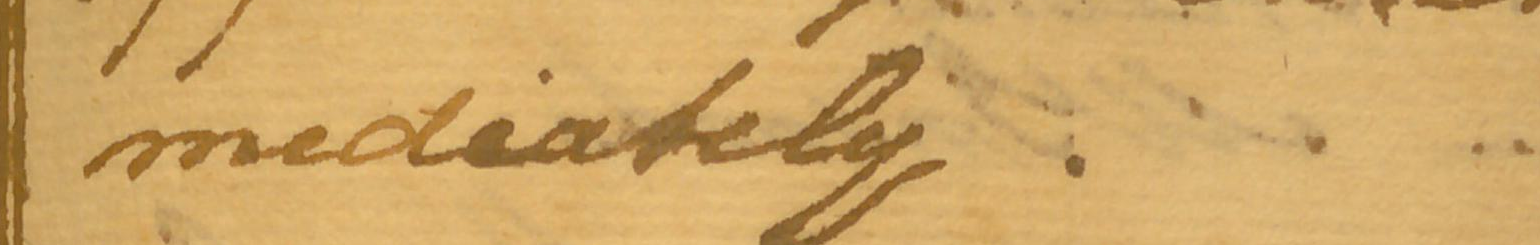mediately.
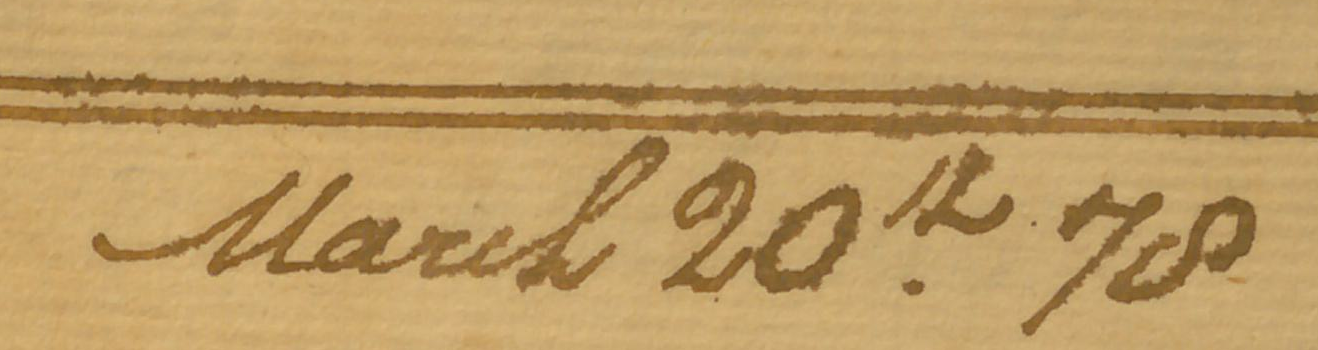March 20^th. 78
